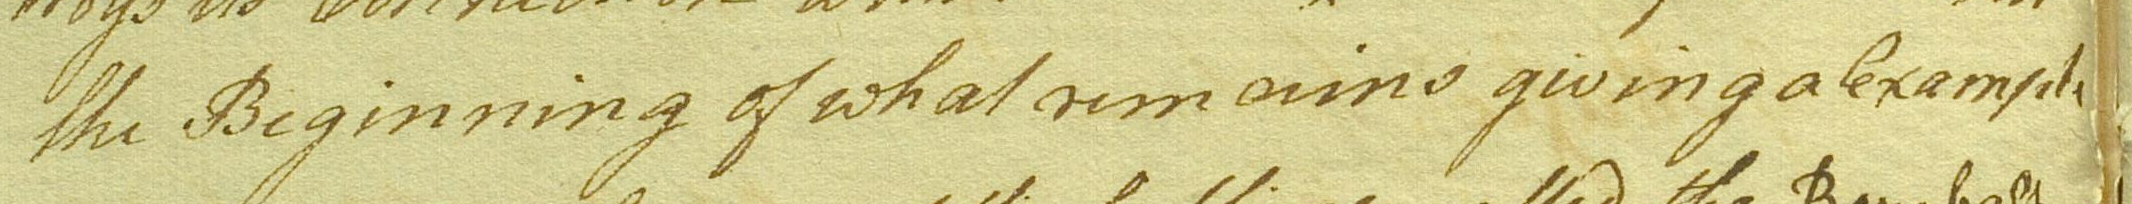the Beginning of what remains giving a example
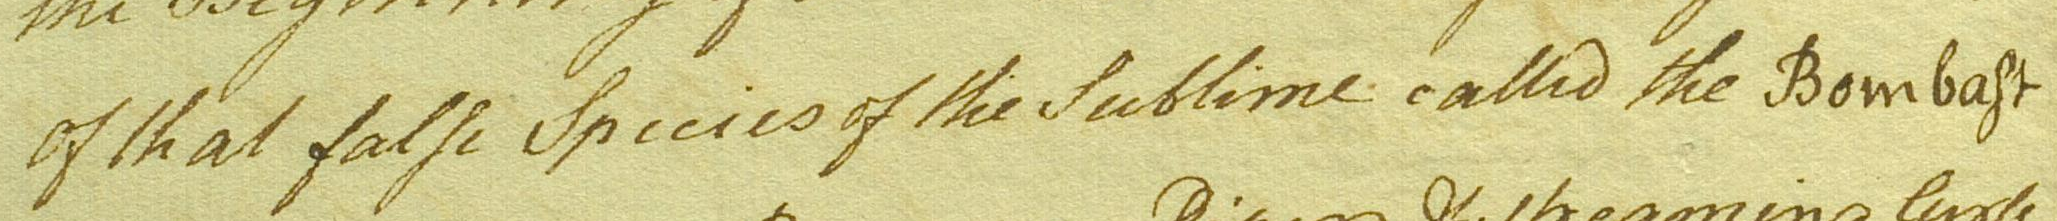of that false Species of the Sublime called the Bombast
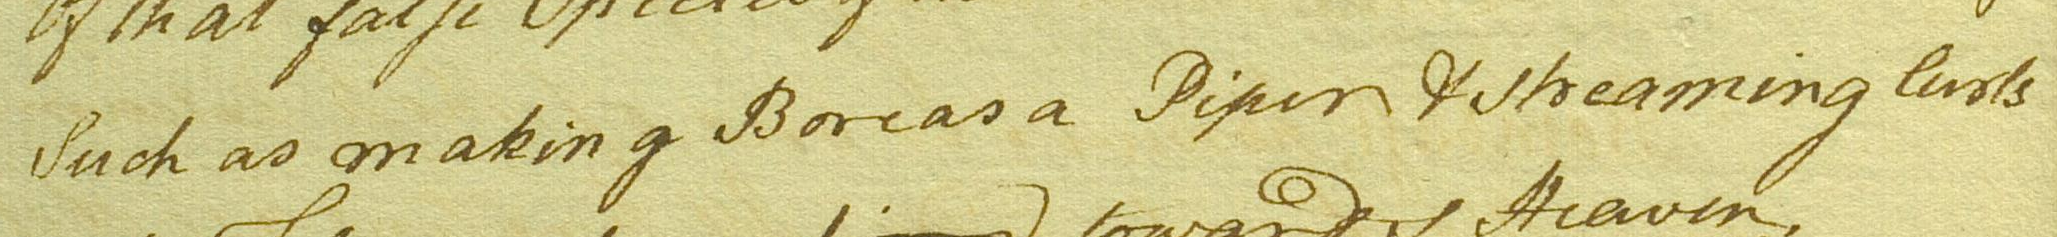such as making Boreas a Piper & streaming Curls
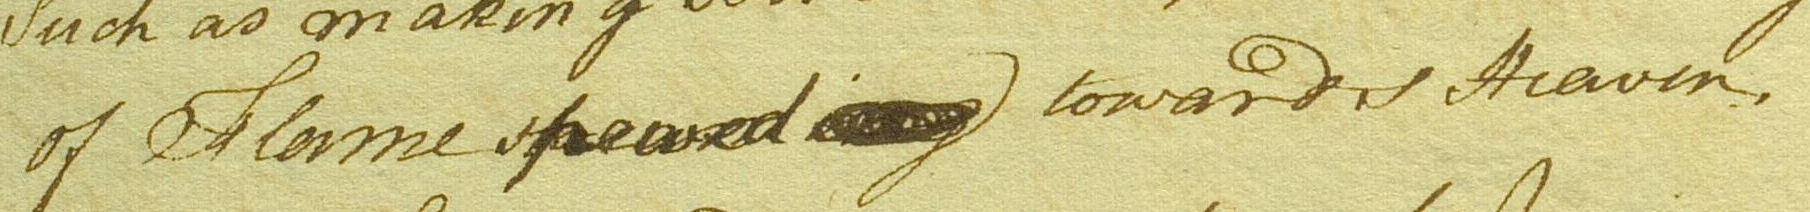of Flame [spewed] [ing] towards Heaven.
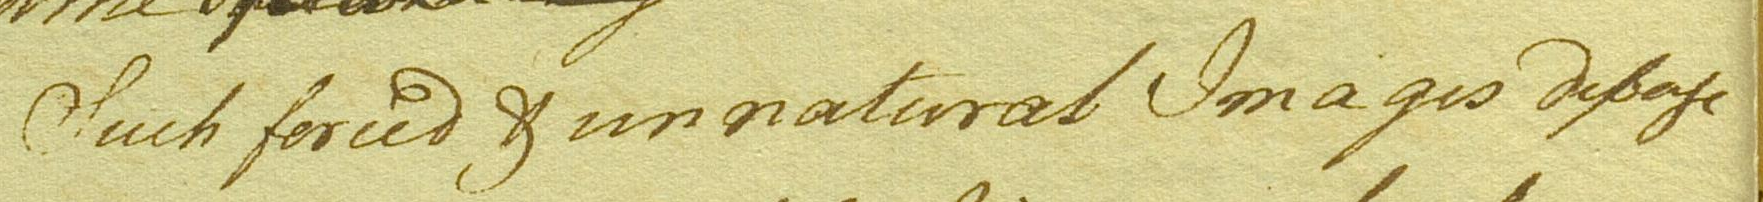Such forced & unnatural Images debase
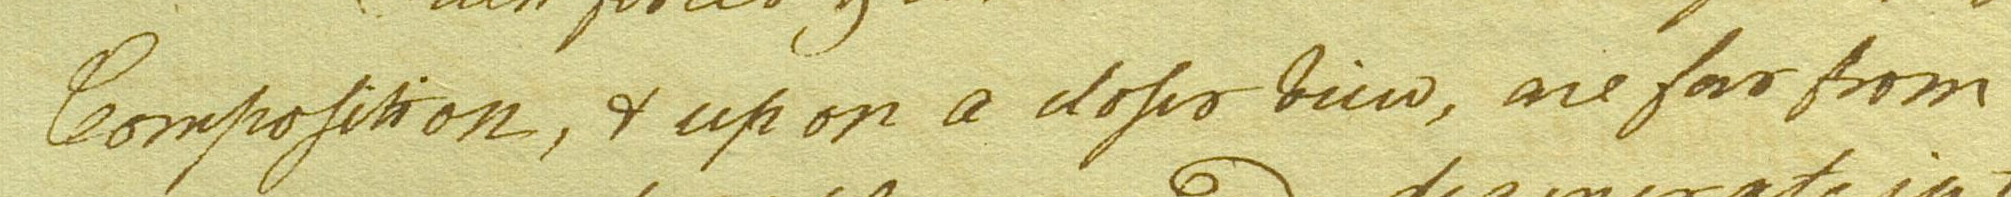Composition, & upon a closer view, are far from
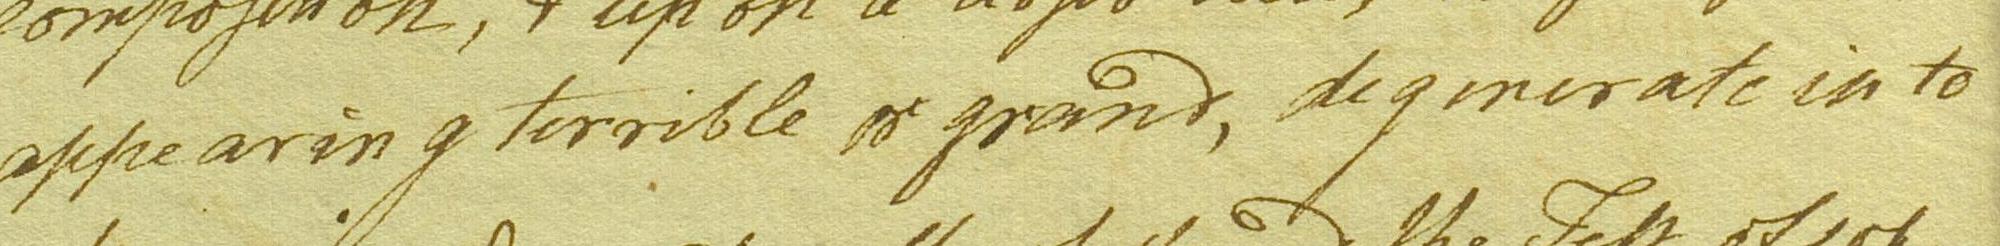appearing terrible or grand, degenerate in to
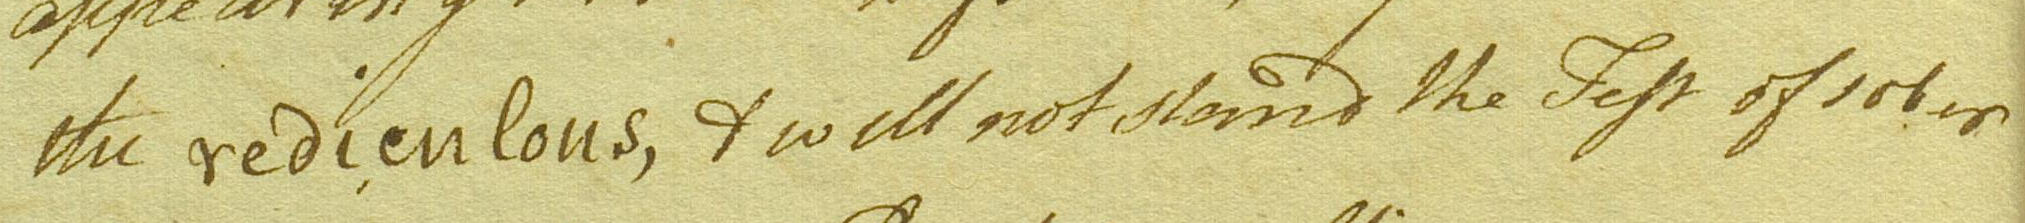the rediculous, & will not stand the Test of sober
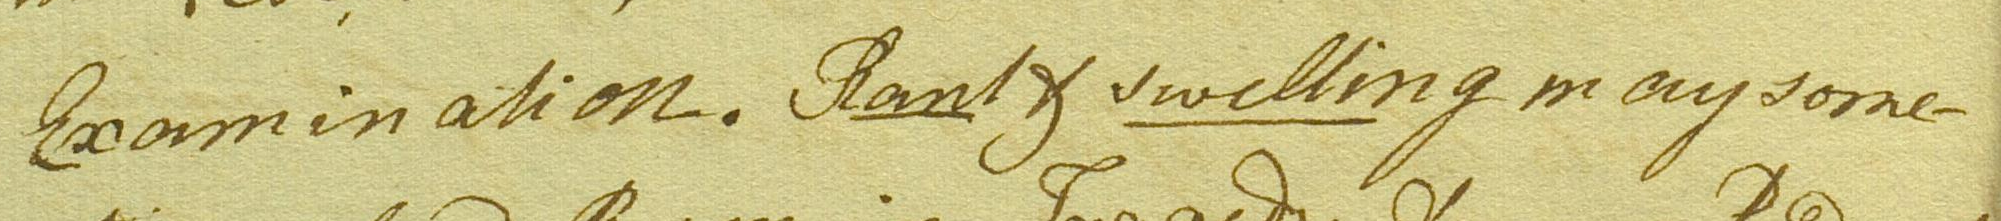Examination. Rant & swelling may some-
